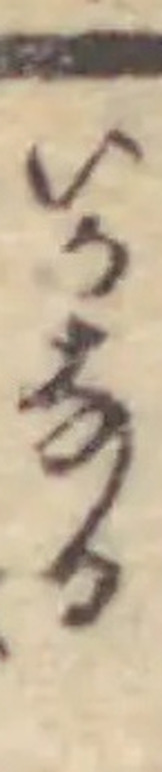いかなる
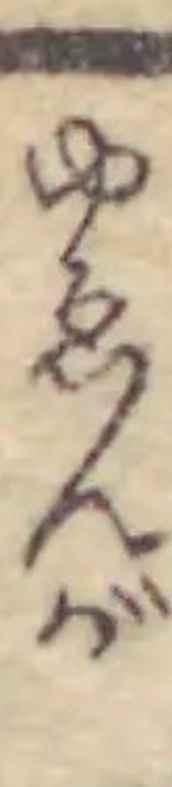ゆゑんが
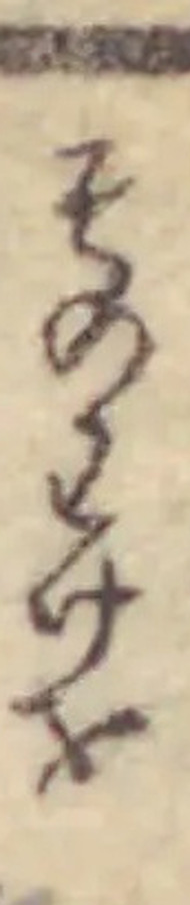そのわけを
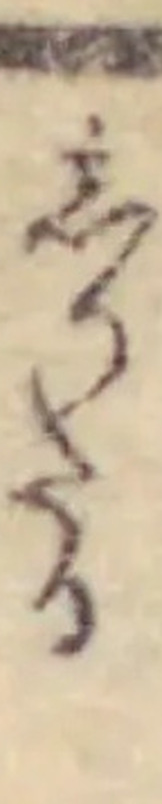しりたる
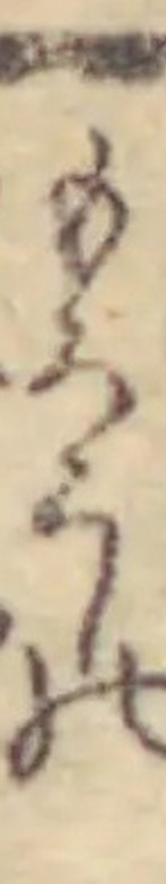もろこしの
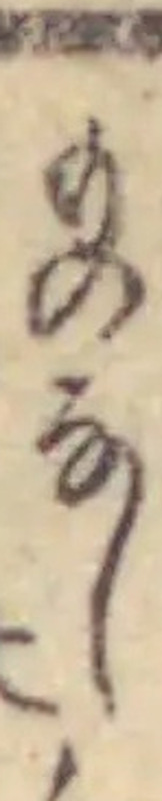ものなし
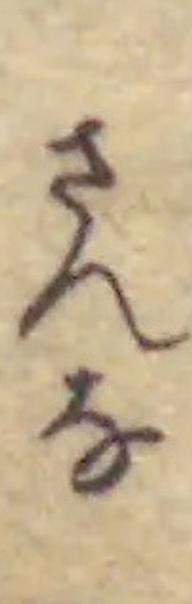さんな
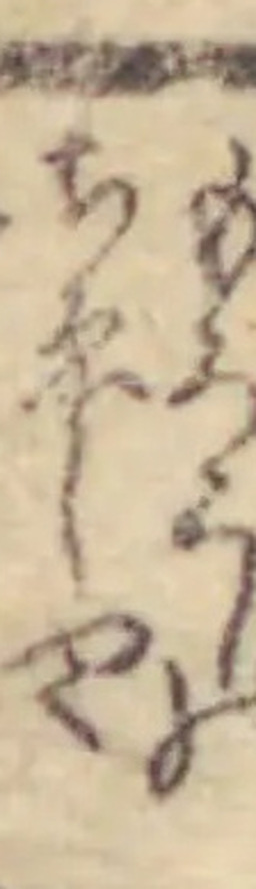ちゑしや
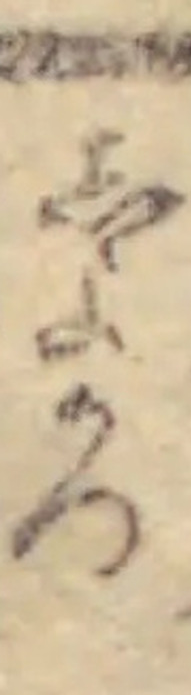しよかつ
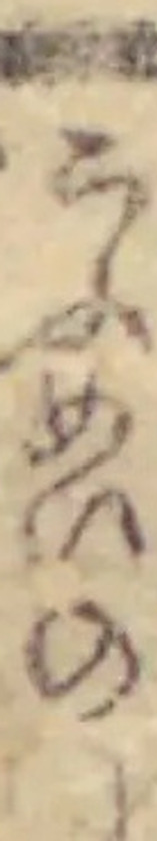こふめいの
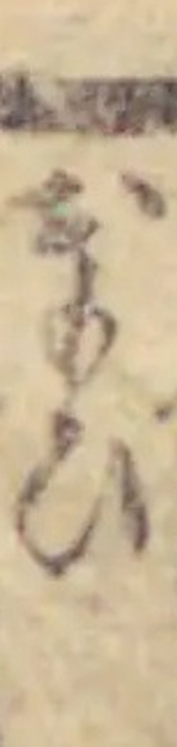おもひ
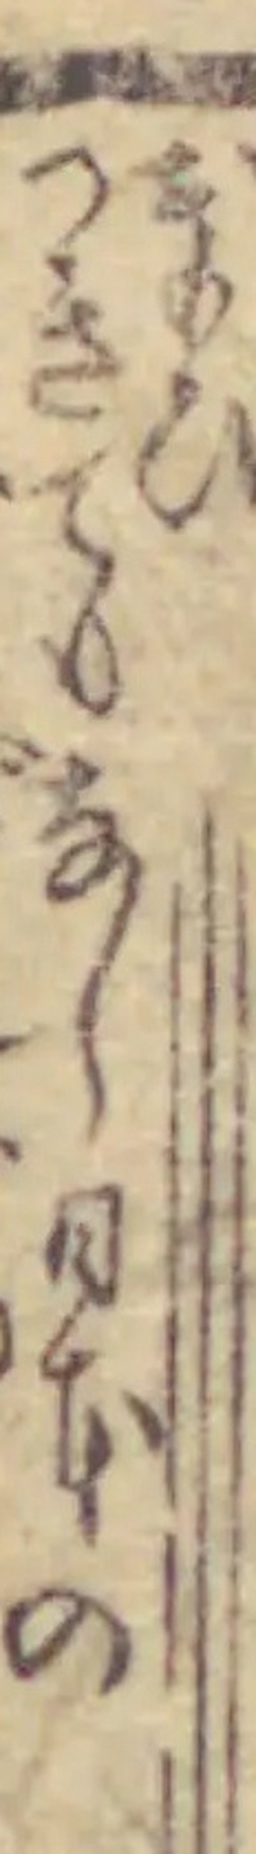つきてもなし日本の
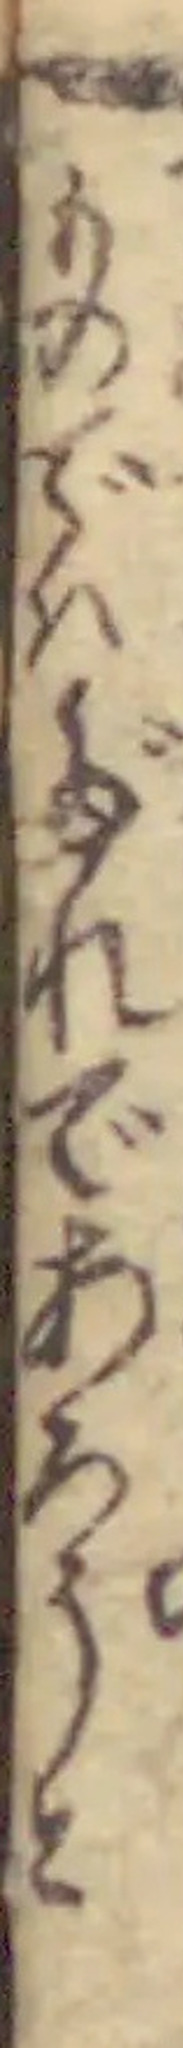ものではだれであろうと
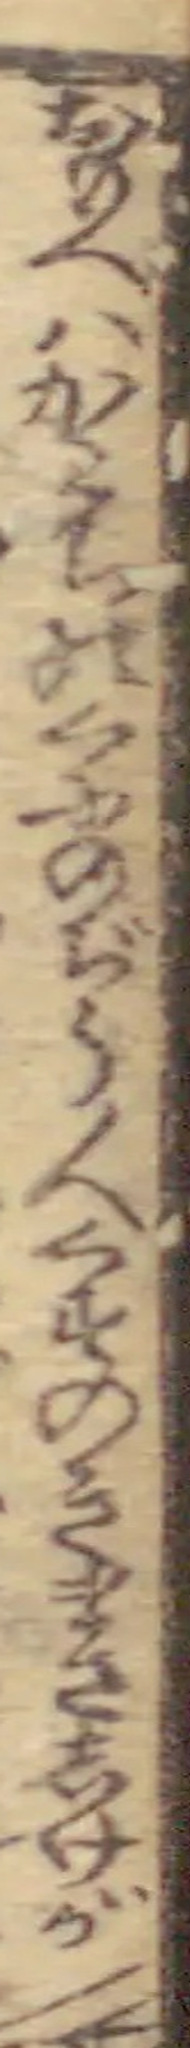おもへはかわちのくにのぢうにんくすのきまさしけが
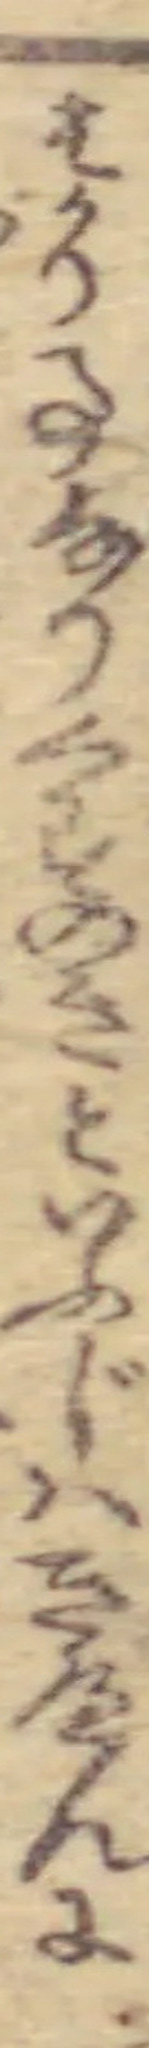はかり事なりくすのきといふじはきへんに
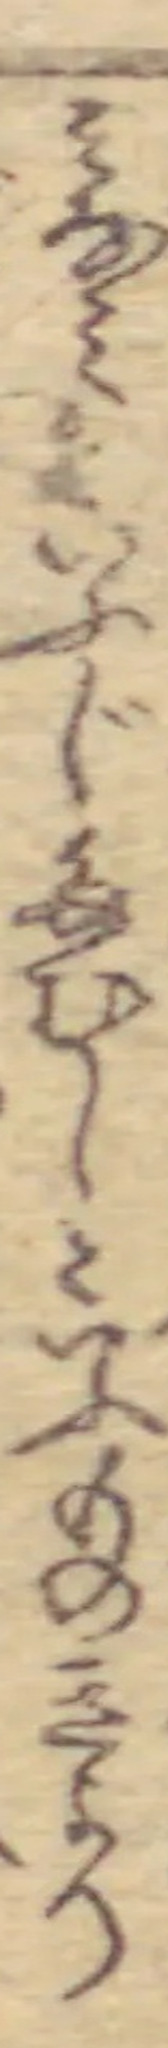みなみといふじたむしといふものきより
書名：家伝寿命薬 2巻
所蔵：国立国会図書館 National Diet Library, JAPAN
